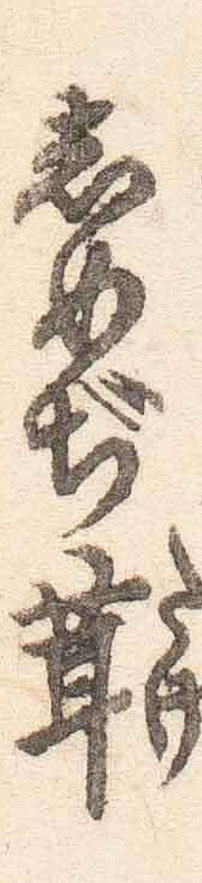しめぢ茸
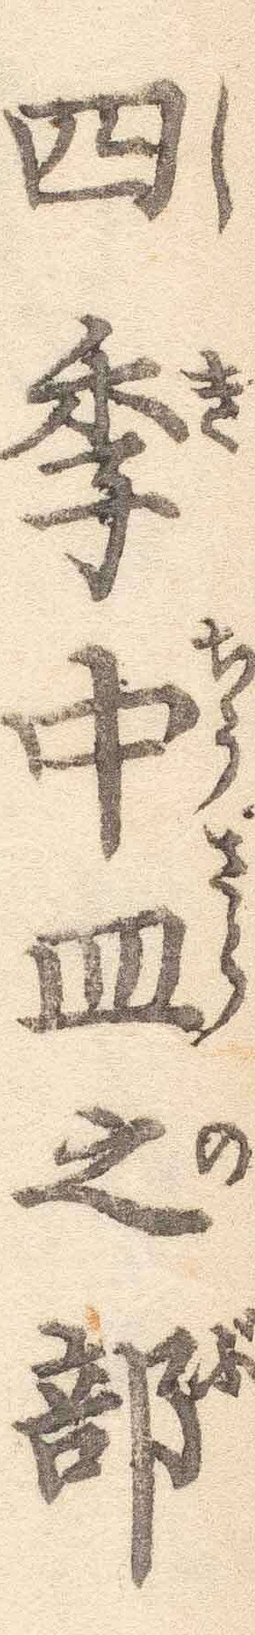四季中皿之部
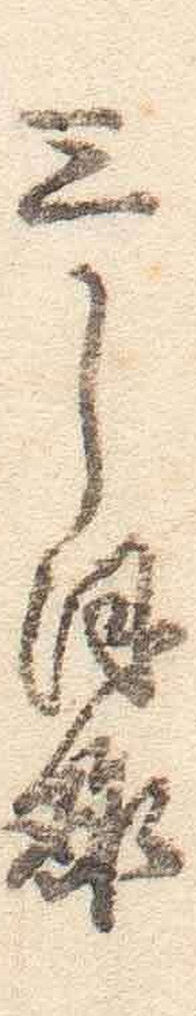三しほ酢
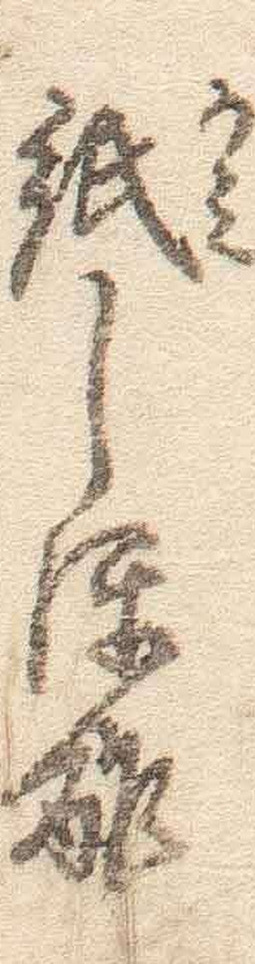三しほ酢
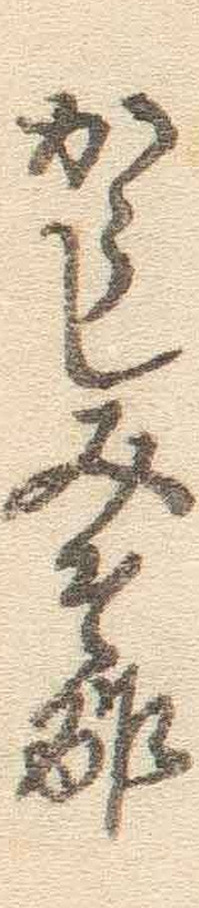からしみそ酢

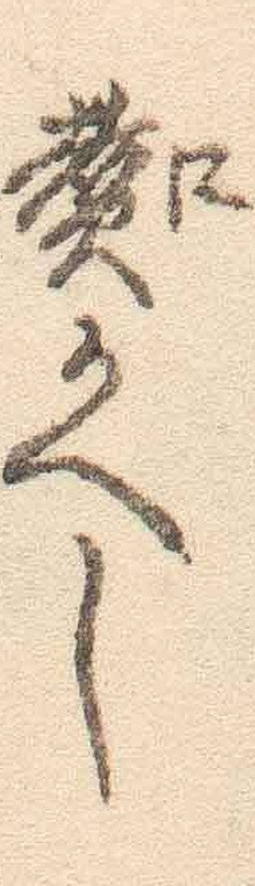煮かへし
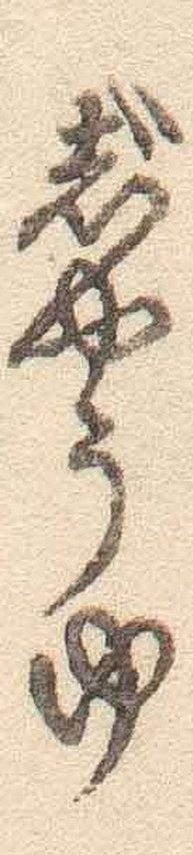じやうゆ
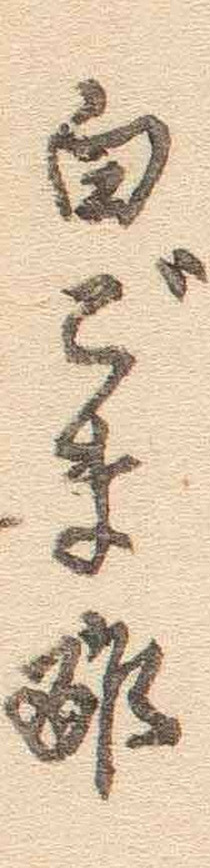白ごま酢
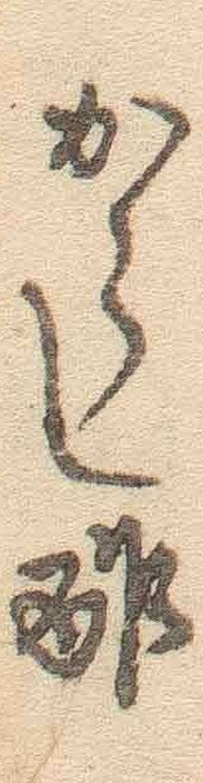からし酢

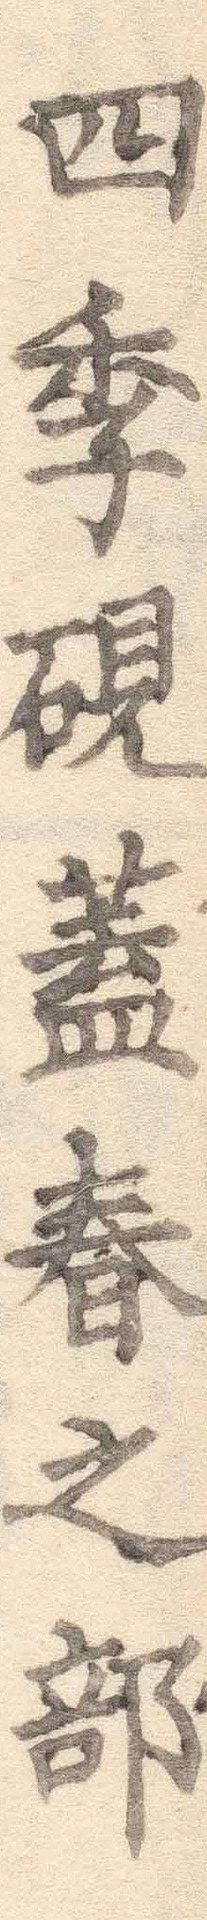四季硯蓋春之部

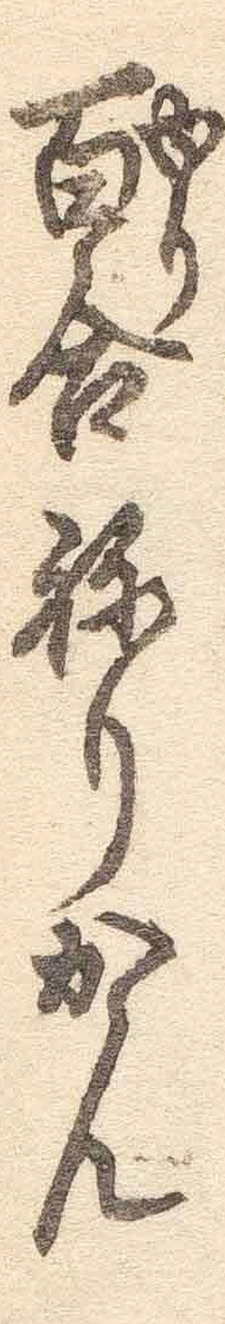百合ねりかん
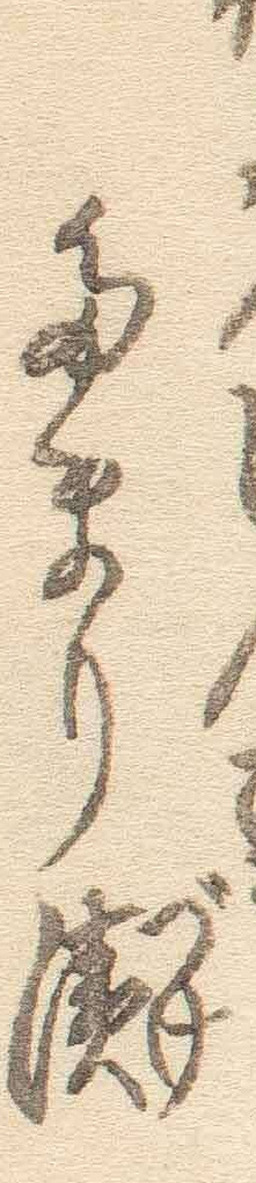たまり漬

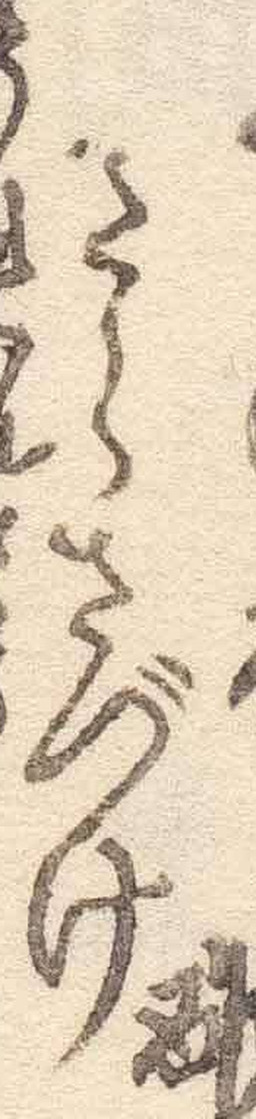さらさづけ
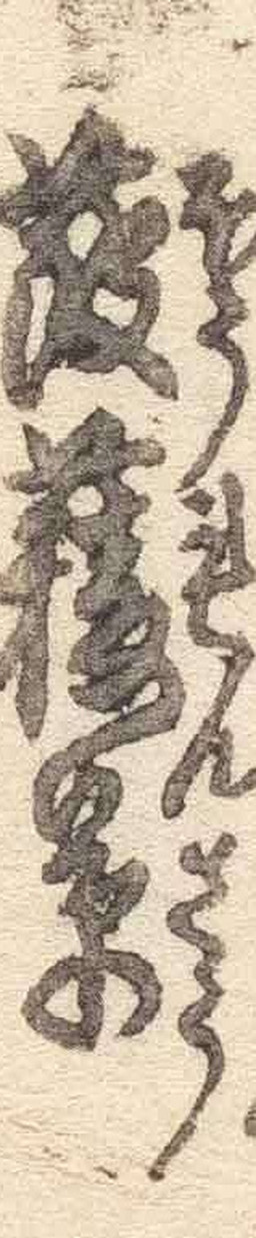菠薐草
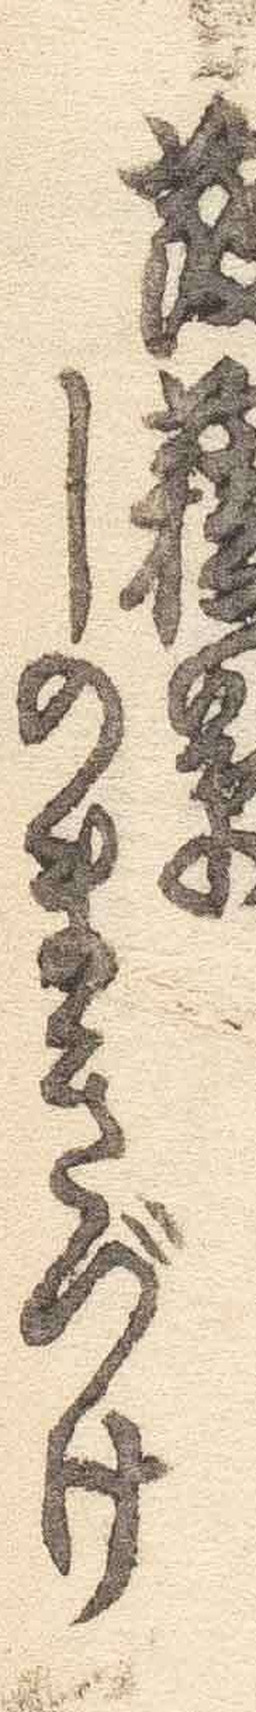しのまきづけ
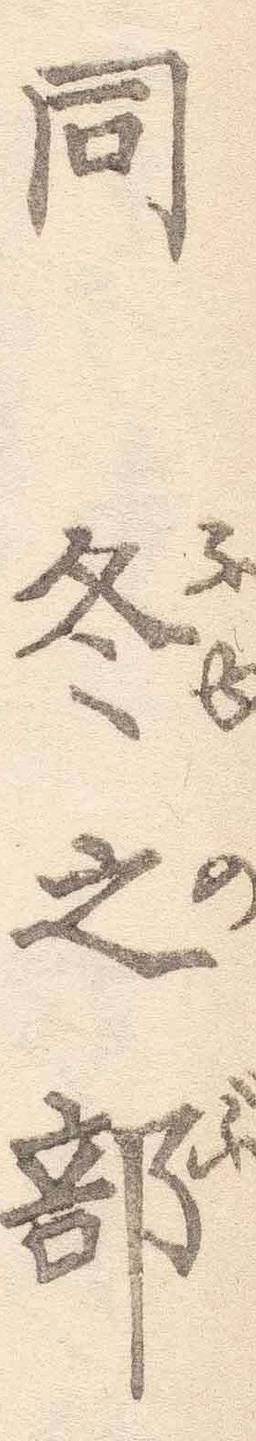同冬之部
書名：料理通
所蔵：東京学芸大学附属図書館 国文学研究資料館
